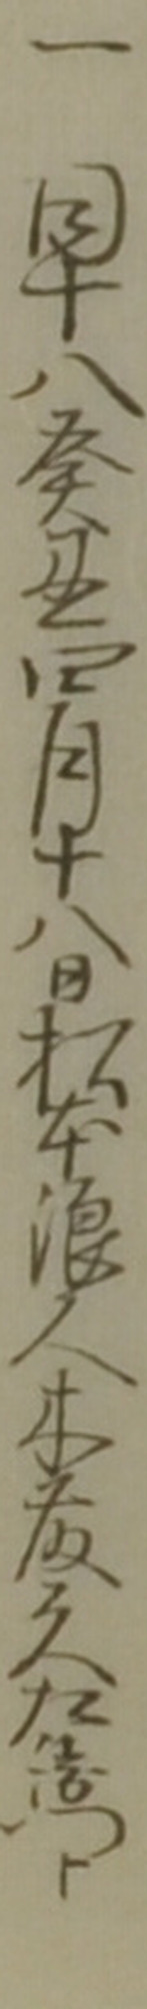一同十八癸丑四月十八日松本浪人木藤久左衛門
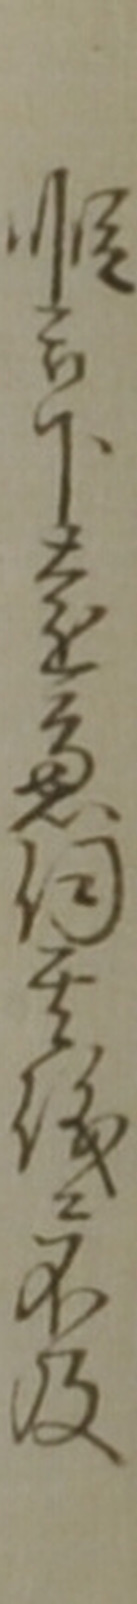暇被下遠慮伺其儀不及

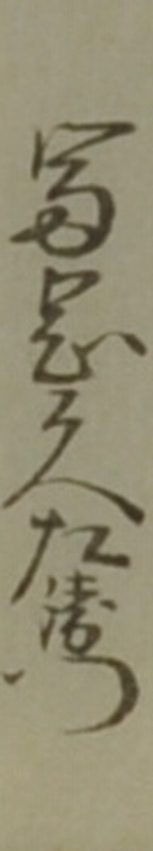富岡久左衛門

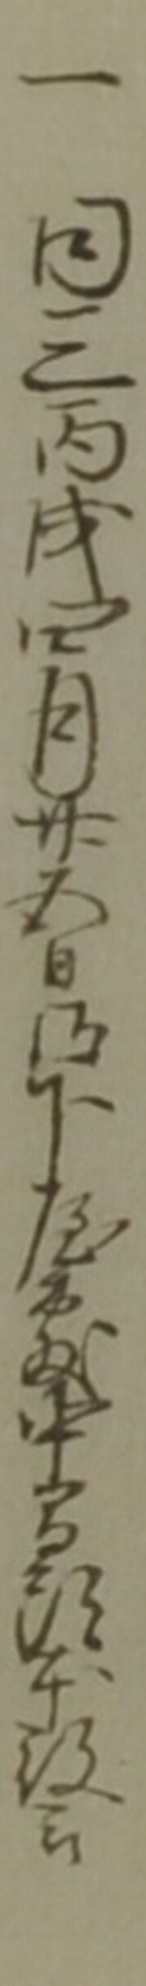一同三丙戌四月廿五日御下屋敷中間頭本役被
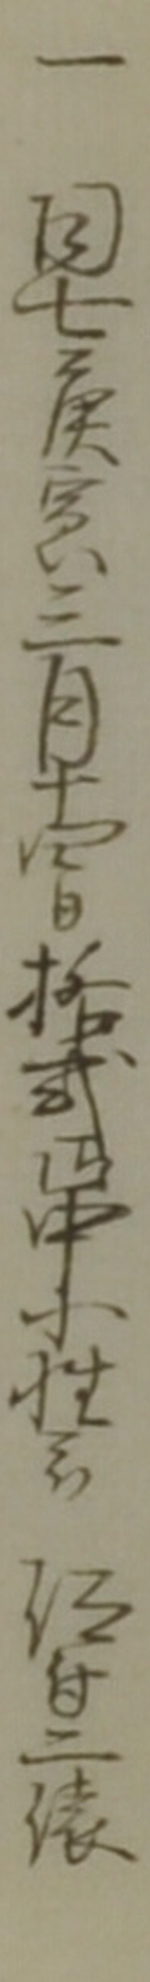一同七庚寅三月十四日格式御中小性被仰付二俵
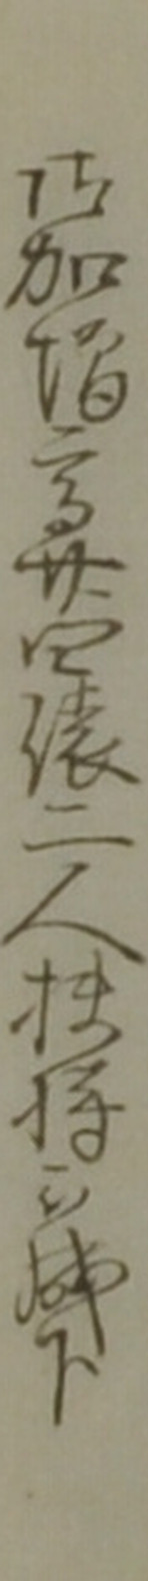御加増高廿四俵二人扶持被成下
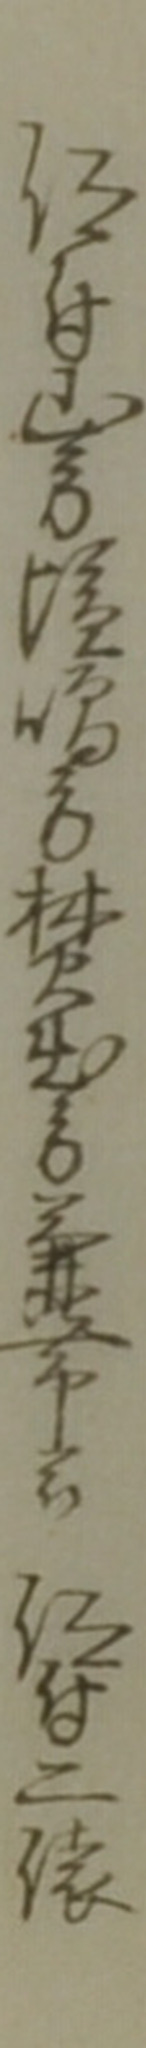仰付山方塩噌方焚出方兼帯被仰付二俵
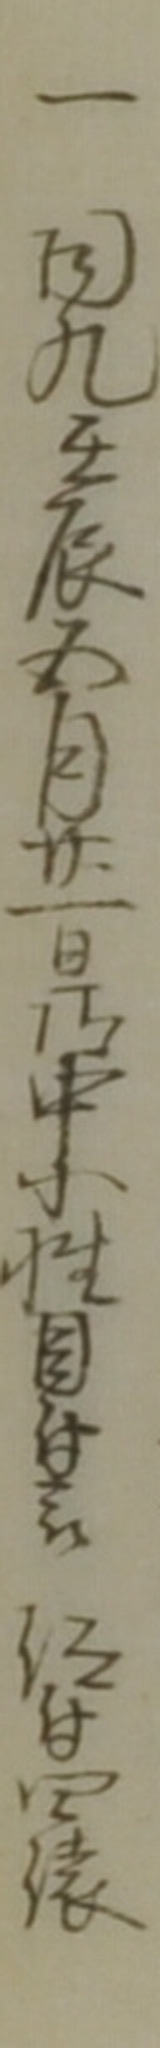一同九壬辰五月廿一日御中小性目付被仰付四俵
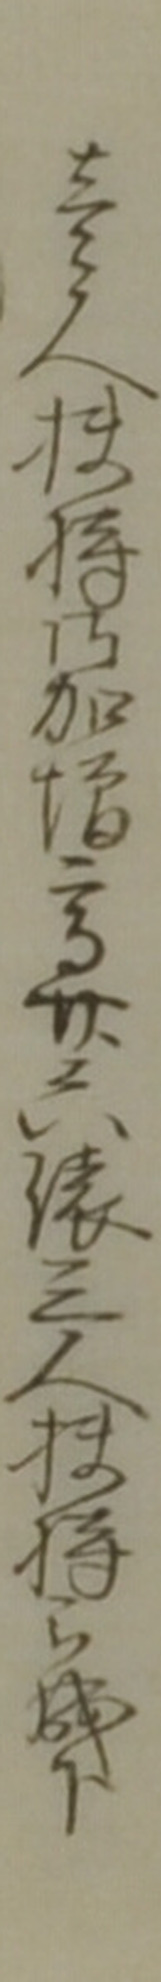壱人扶持御加増高廿六俵三人扶持被成下
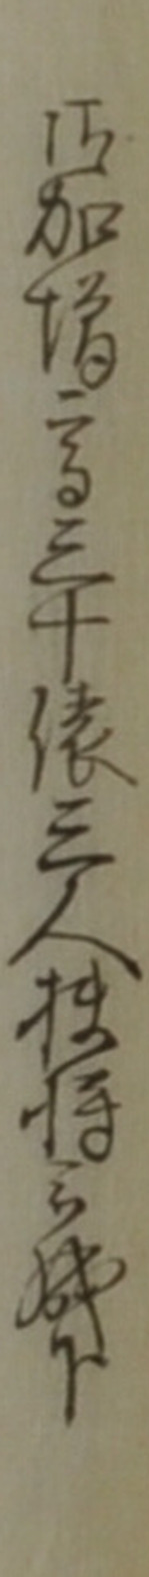御加増高三十俵三人扶持被成下
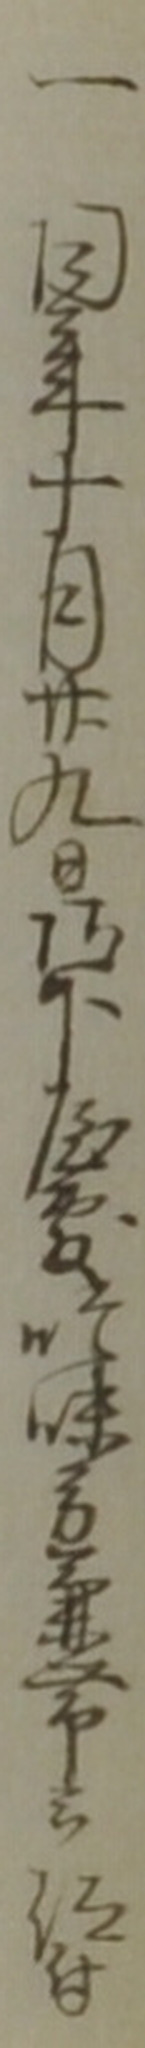一同年十月廿九日御下屋敷吟味方兼帯被仰付
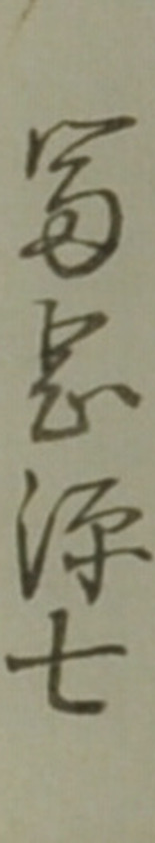富岡源七

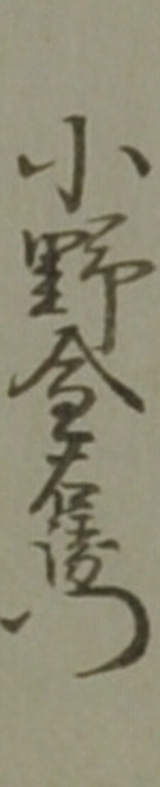小野金右衛門

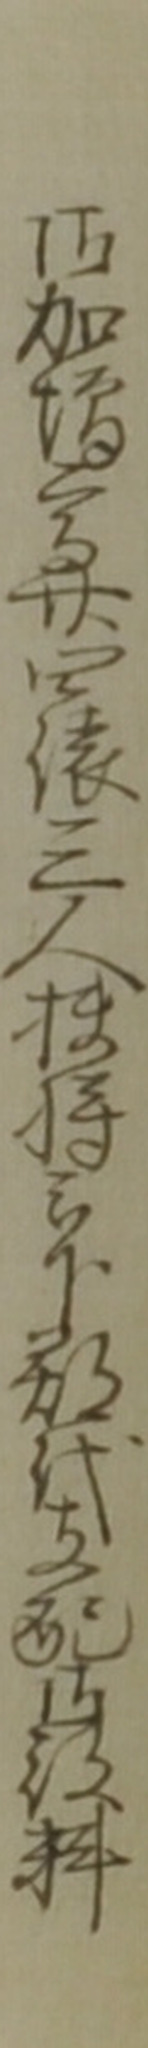御加増高廿四俵三人扶持被下郡代支配御役料

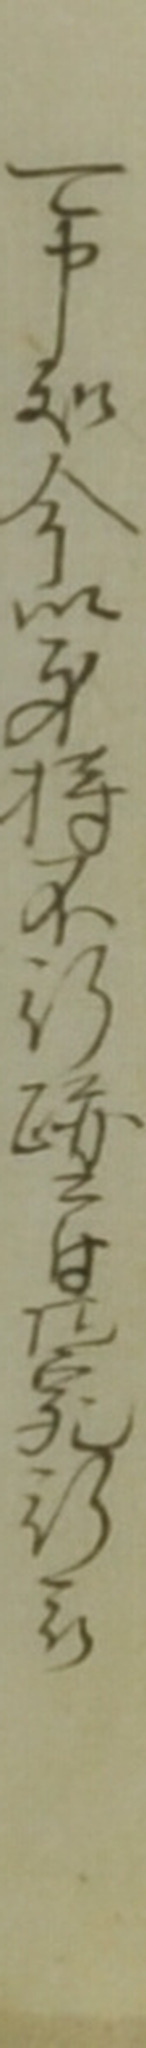可申処今以身持不行跡ニ付御宛行被
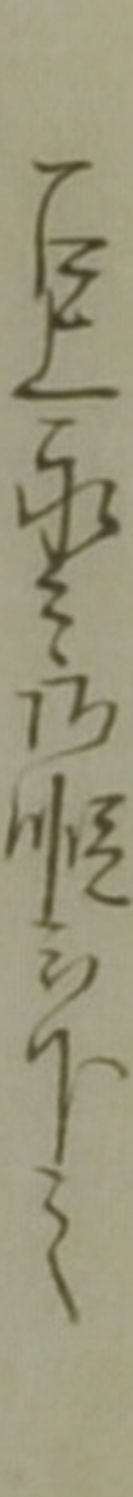召上永之御暇被下之
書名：無足廃家（弐）
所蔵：伊那市立高遠町図書館・合同会社AMANE
